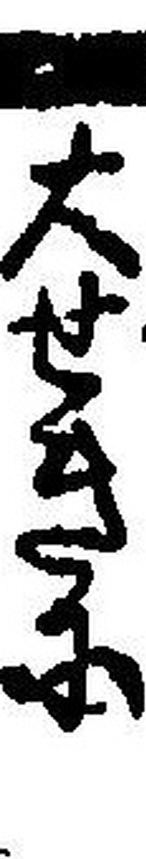大せきに
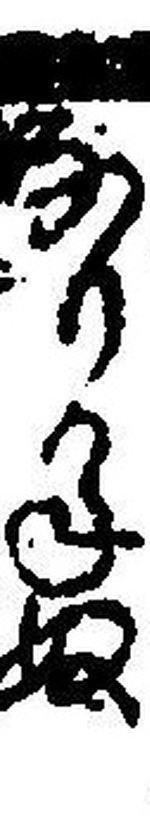なりかねぬ
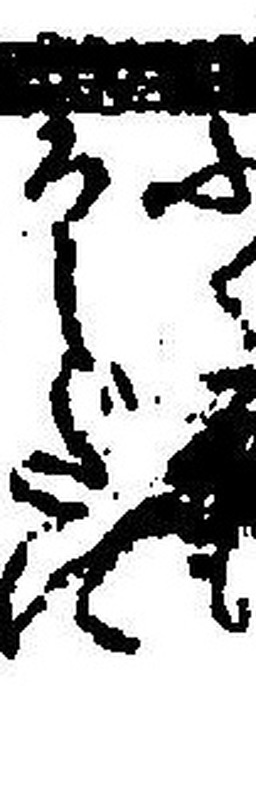かしだに
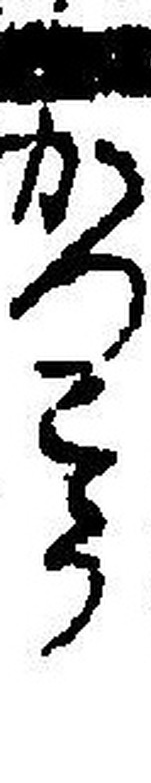かつこう
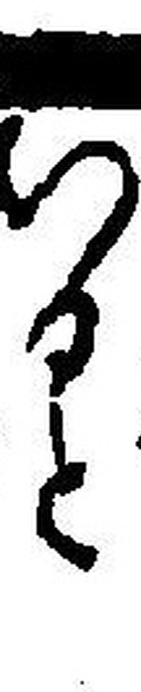いると
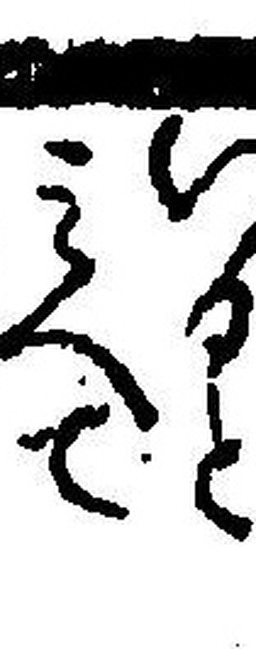みへて
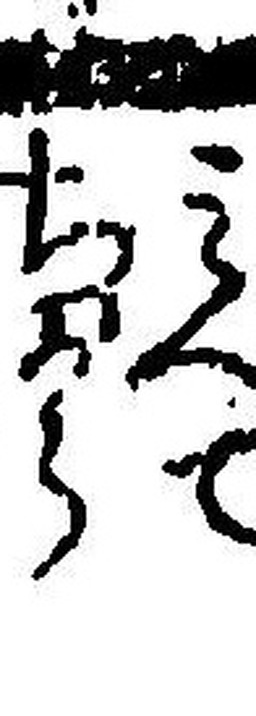ちから
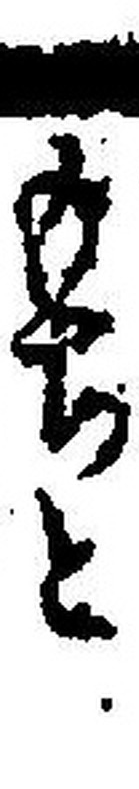もちと
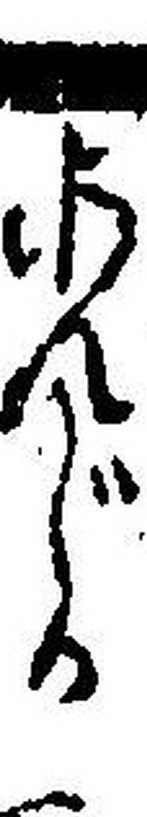あんじか
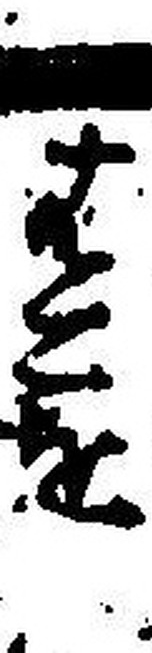はこを
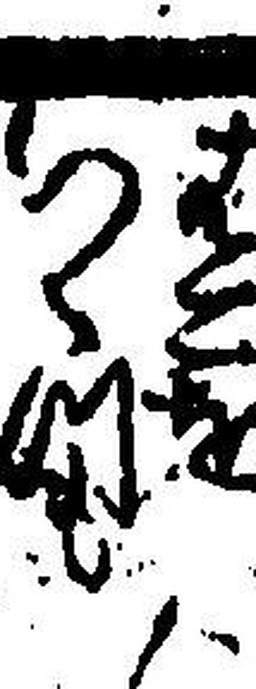いくつも
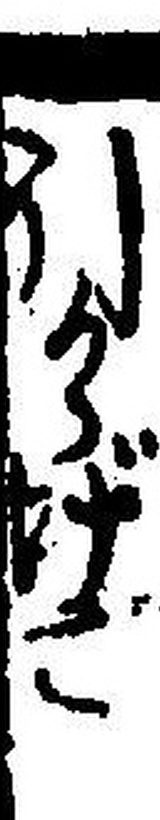引からげて
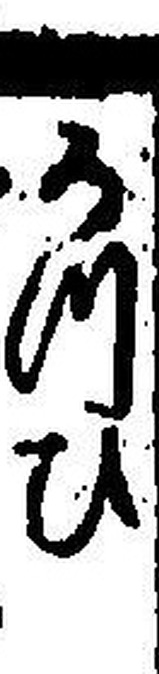かつひ
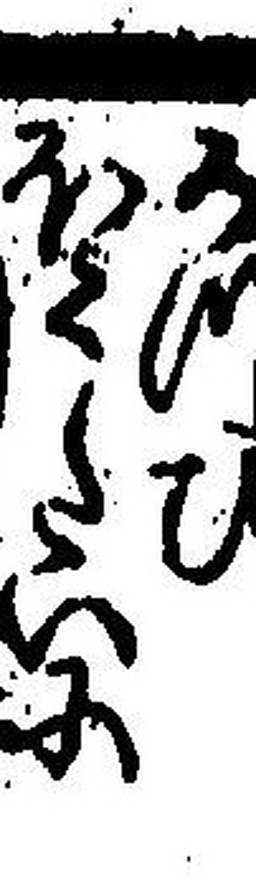ほうたいに
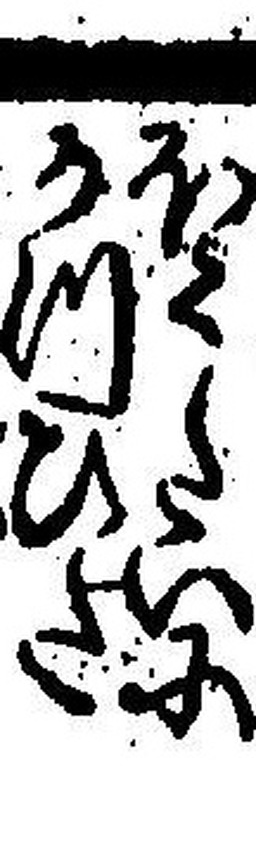かつひた
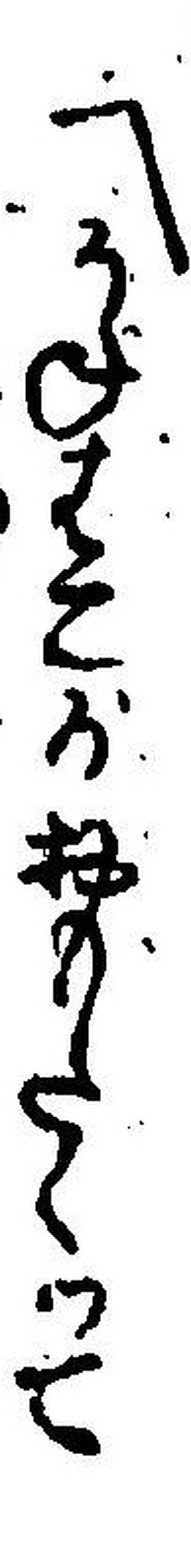〽かねはこがおもたくつて
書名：徳若水縁起金性 / 樹下石上作
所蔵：東京大学総合図書館 General Library in the University of Tokyo, JAPAN
